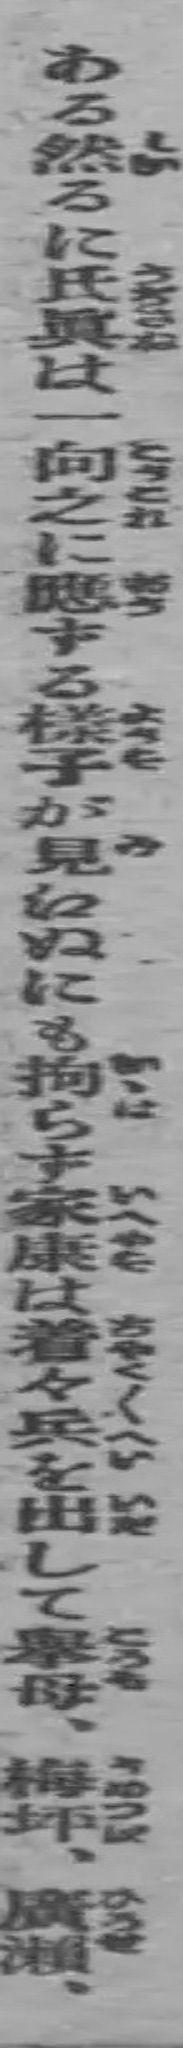ある然るに氏真は一向之に応ずる様子が見えぬにも拘らず家康は着々兵を出して挙母、梅坪、広瀬、
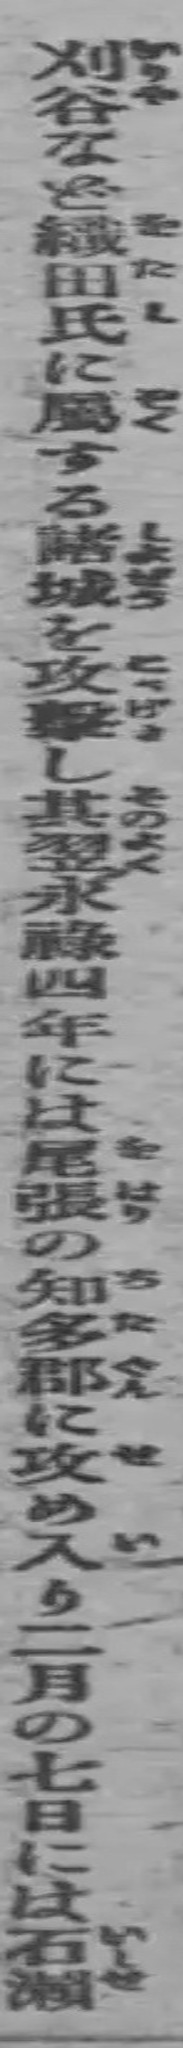刈谷など織田氏に属する諸城を攻撃し其翌永禄四年には尾張の知多郡に攻め入り二月の七日には石瀬
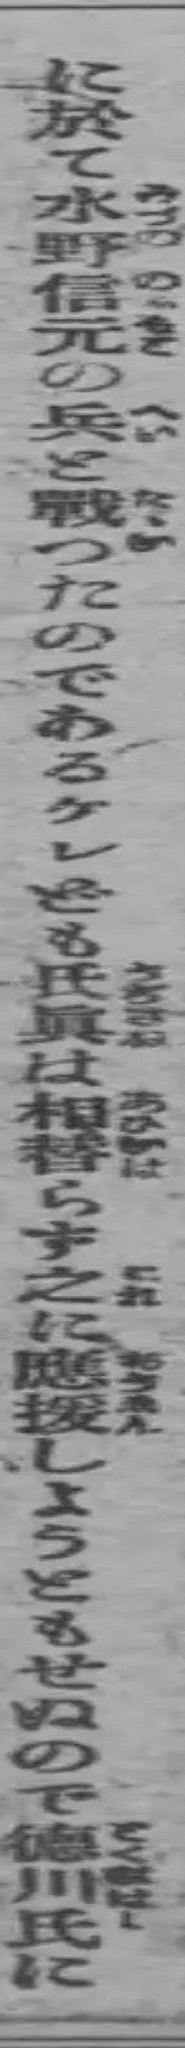石瀬合戦に於て水野信元の兵と戦つたのであるケレども氏真は相替らず之に応援しようともせぬので徳川氏に
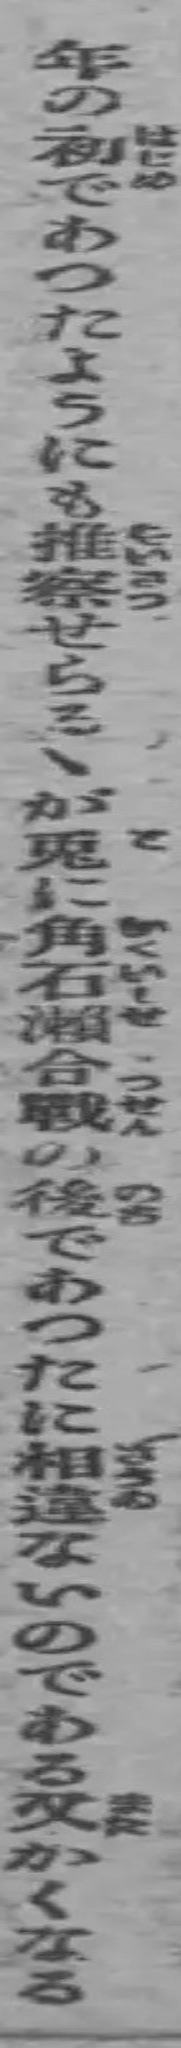和す年の初であつたようにも推察せらるゝが兎に角石瀬合戦の後であつたに相違ないのである又かくなる
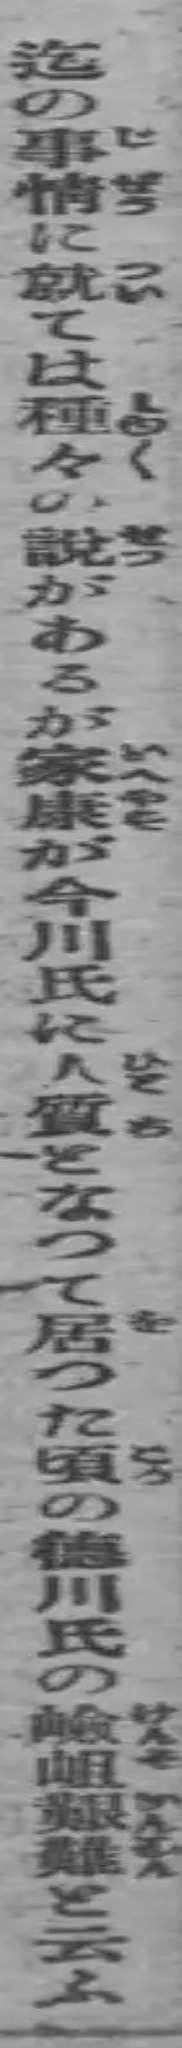迄の事情に就ては種々の説があるが家康が今川氏に人質となつて居つた頃の徳川氏の嶮岨艱難と云ふ
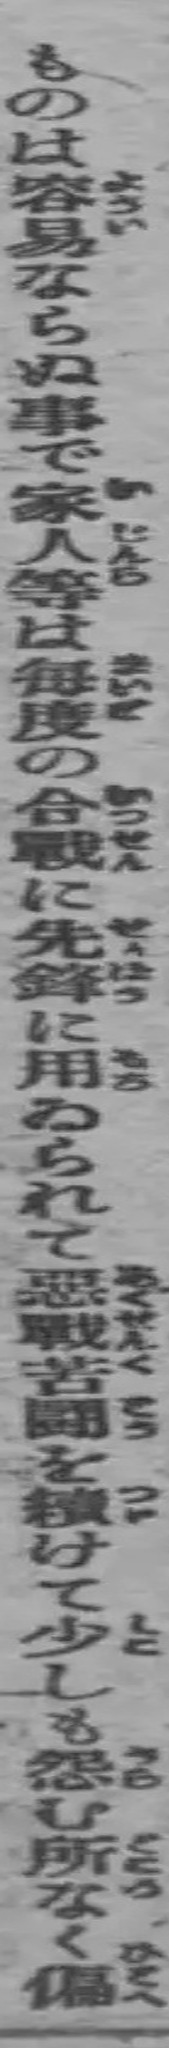ものは容易ならぬ事で家人等は毎度の合戦に先鋒に用ゐられて悪戦苦闘を続けて少しも怨む所なく偏
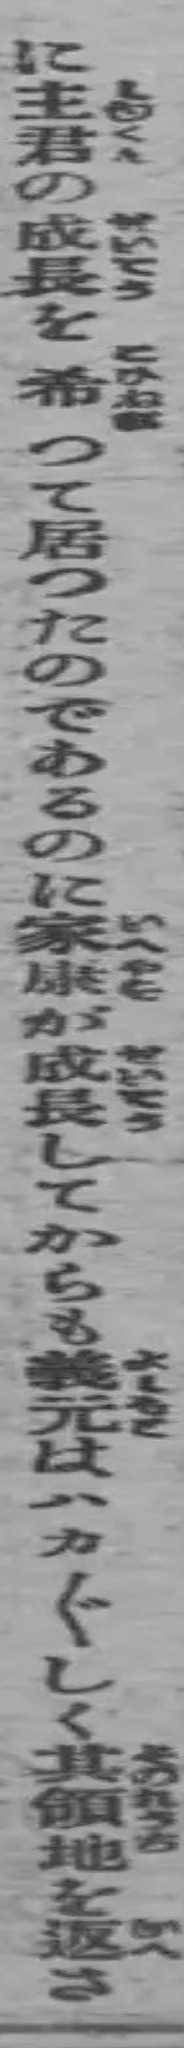に主君の成長を希つて居つたのであるのに家康が成長してからも義元はハカ〴〵しく其領地を返さ
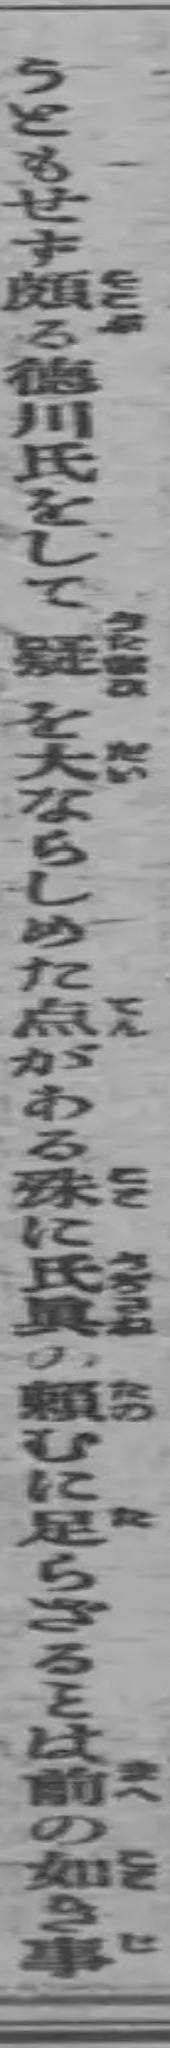うともせず頗る徳川氏をして疑を大ならしめた点がある殊に氏真の頼むに足らざることは前の如き事
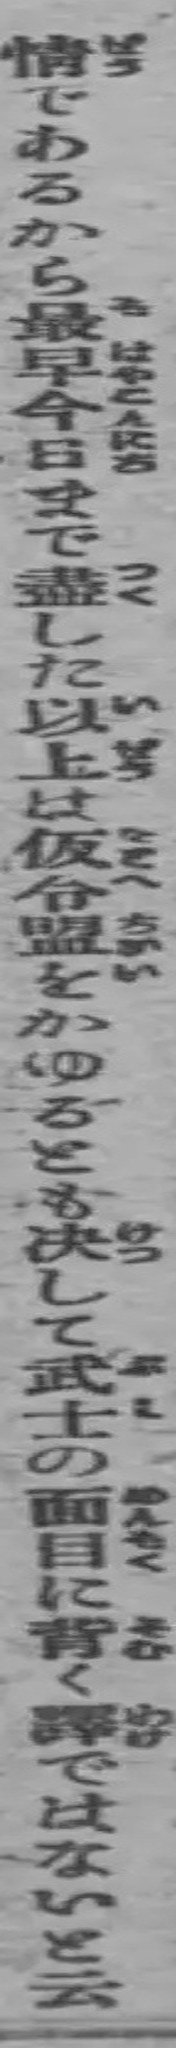情であるから最早今日まで尽した以上は仮令盟をかゆるとも決して武士の面目に背く訳ではないと云
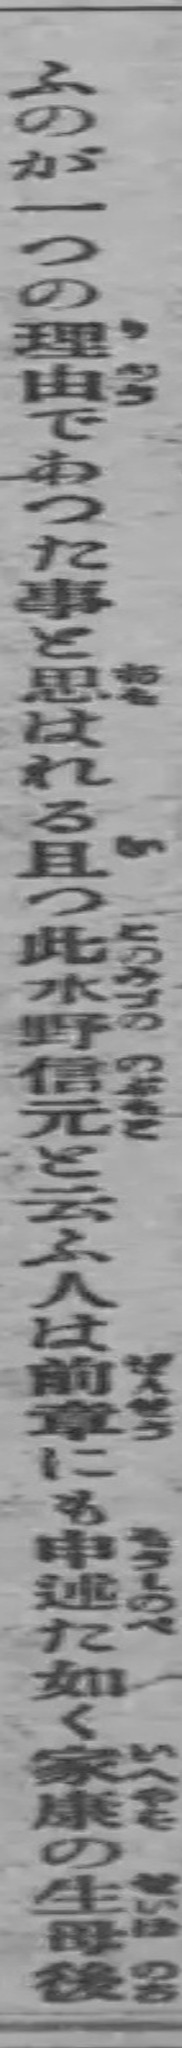ふのが一つの理由であつた事と思はれる且つ此水野信元と云ふ人は前章にも申述た如く家康の生母後
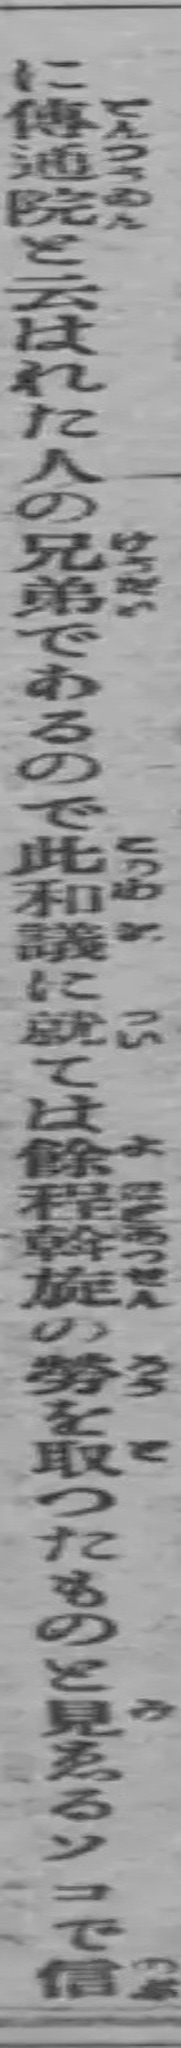に伝通院と云はれた人の兄弟であるので此和議に就ては余程斡旋の労を取つたものと見ゑるソコで信
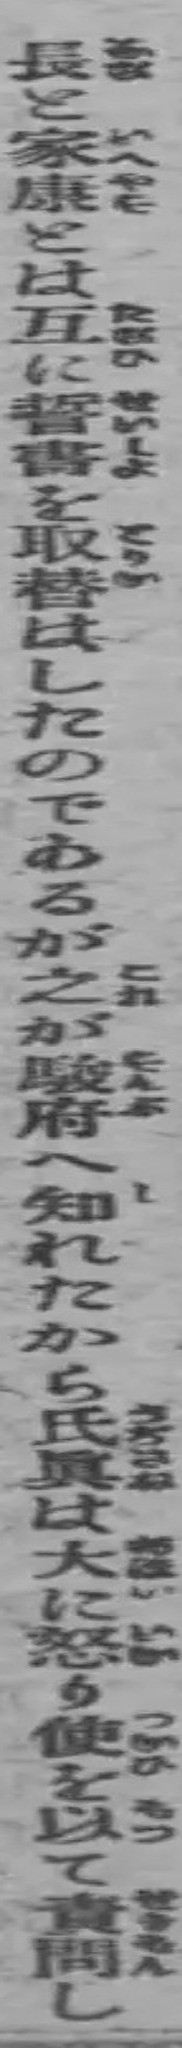長と家康とは互に誓書を取替はしたのであるが之が駿府へ知れたから氏真は大に怒り使を以て責問し
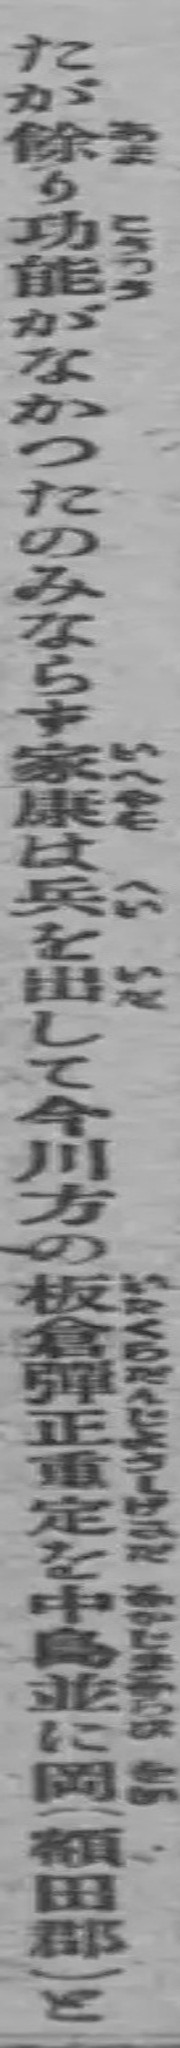中島の戦たが余り功能がなかつたのみならず家康は兵を出して今川方の板倉弾正重定を中島並に岡(額田郡)と
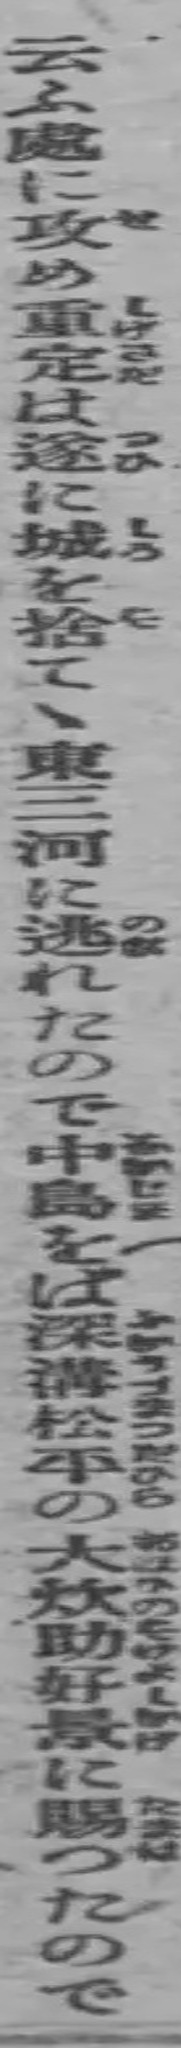云ふ処に攻め重定は遂に城を捨てゝ東三河に逃れたので中島をば深溝松平の大炊助好景に賜つたので
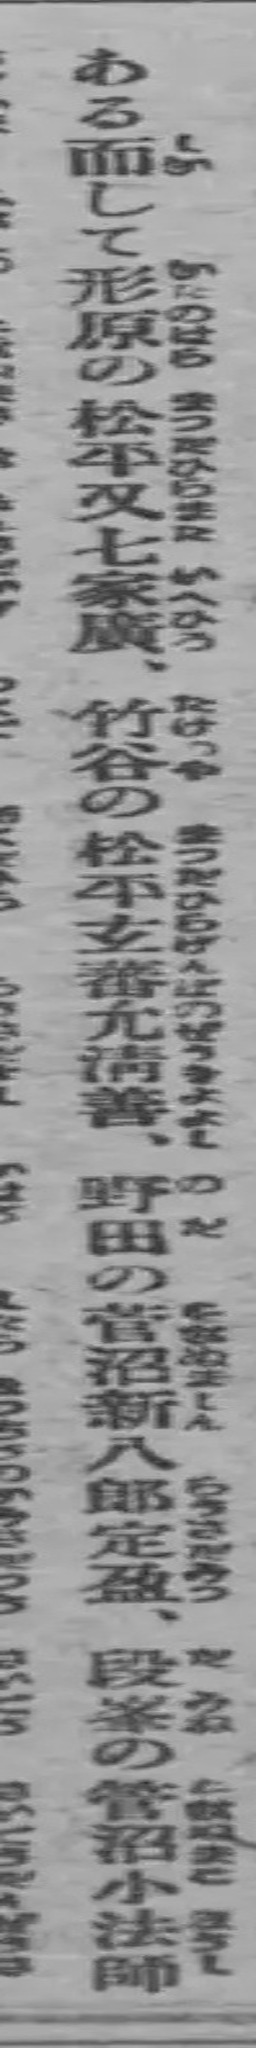ある而して形原の松平又七家広、竹谷の松平玄蕃允清善、野田の菅沼新八郎定盈、段峯の菅沼小法師
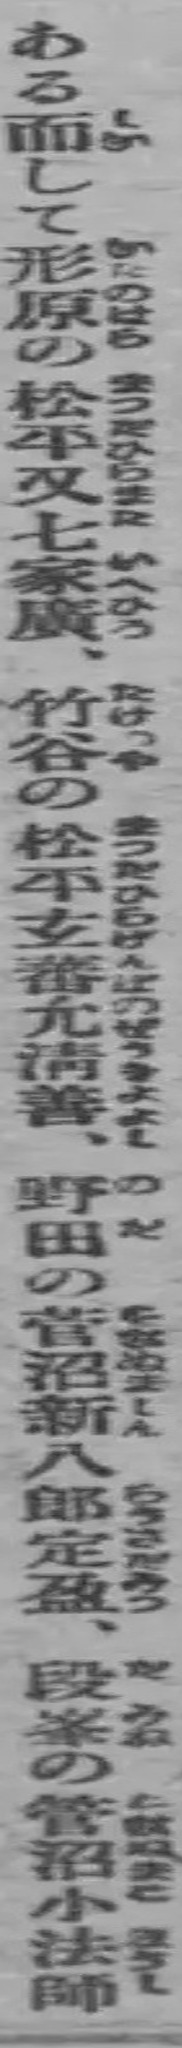ある而して形原の松平又七家広、竹谷の松平玄蕃允清善、野田の菅沼新八郎定盈、段峯の菅沼小法師
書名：豊橋市史談
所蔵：国立国会図書館 National Diet Library, JAPAN
